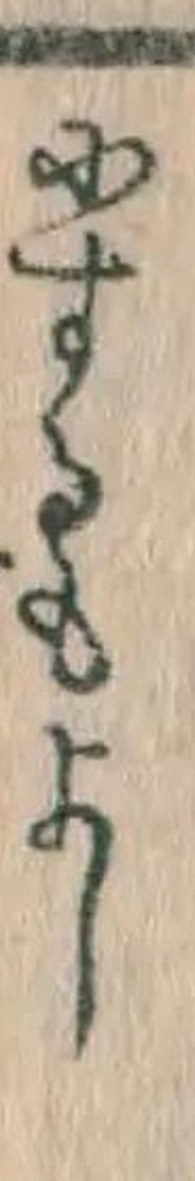にするもよし
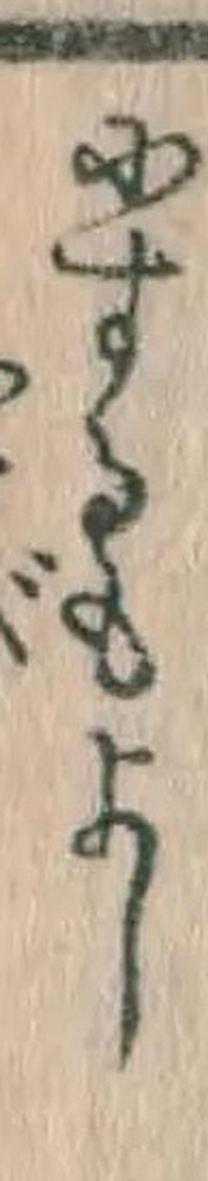にするもよし
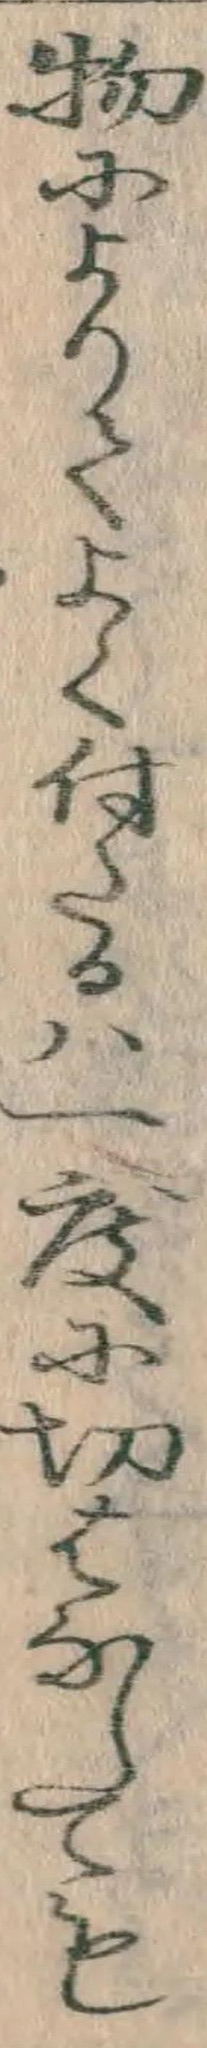物によりてよく付たるは一度に切はなしても
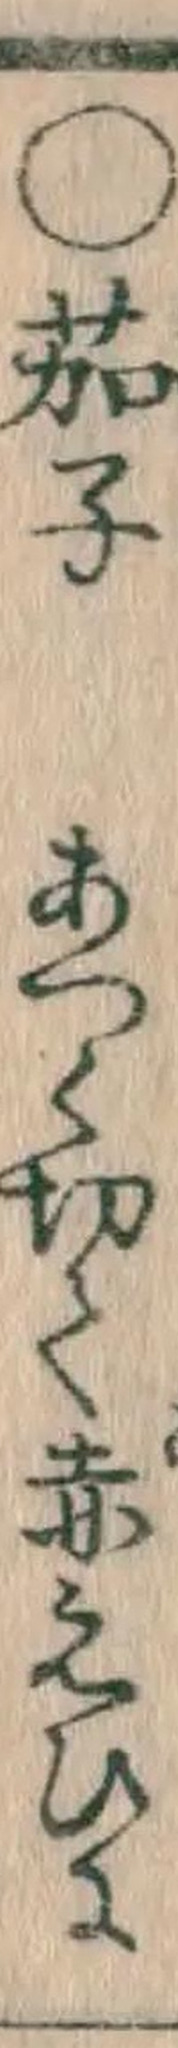○茄子あつく切て赤えひに
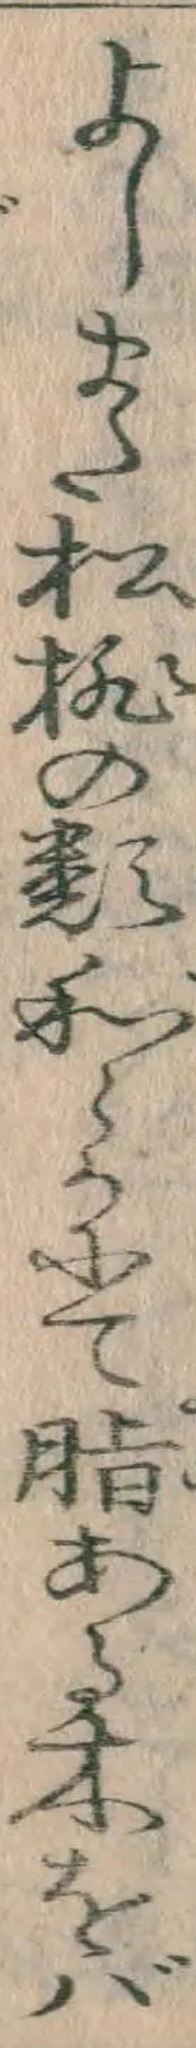よしまた松桃の類和らかにて脂ある木をば
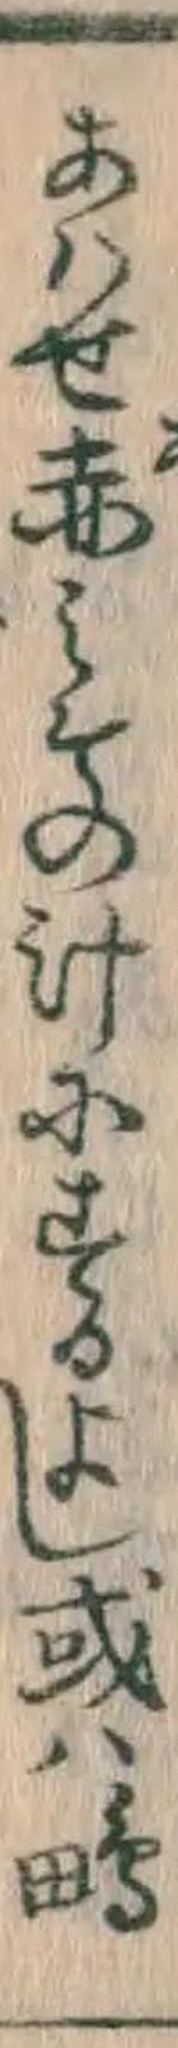あはせ赤みその汁にするよし或は鴫
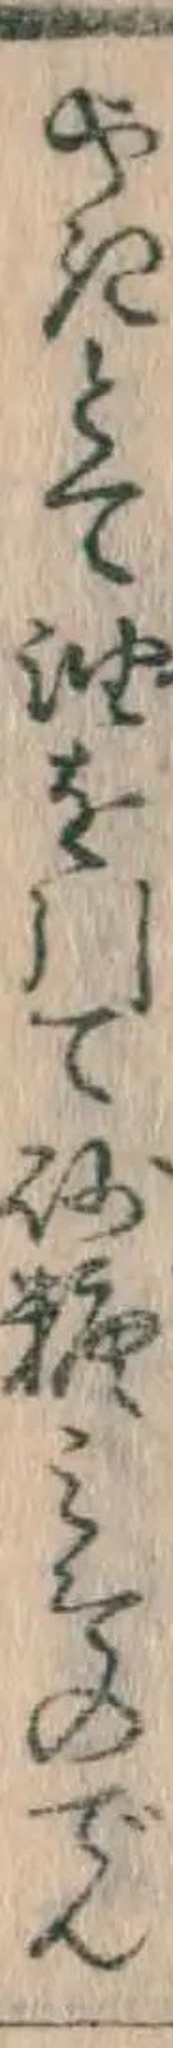やきとて油を引て砂糖みそのでん
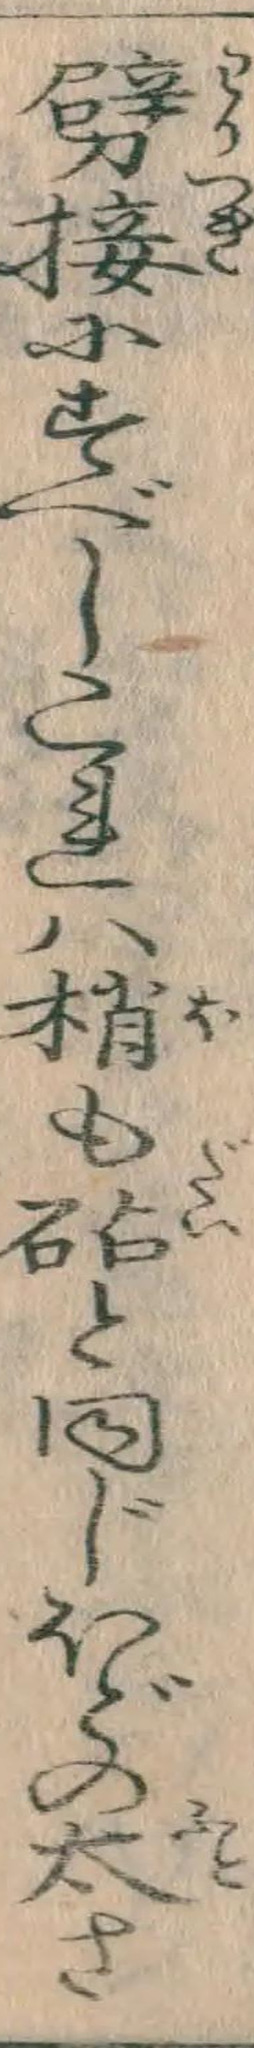劈接にすべしこれは梢も砧と同じほどの太さ
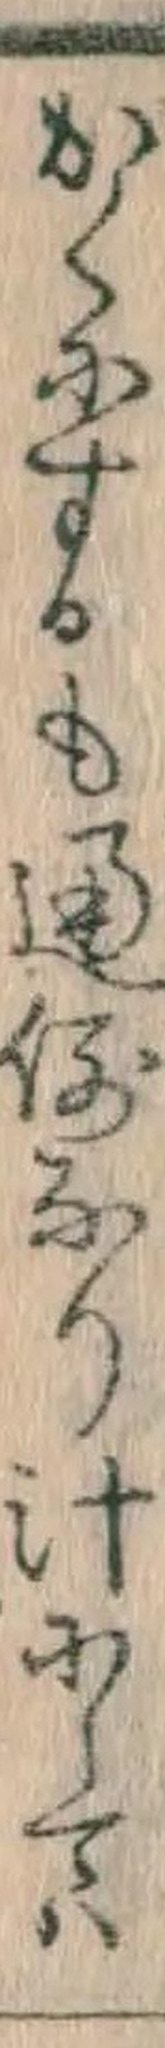がくにするも通例なり汁にしては
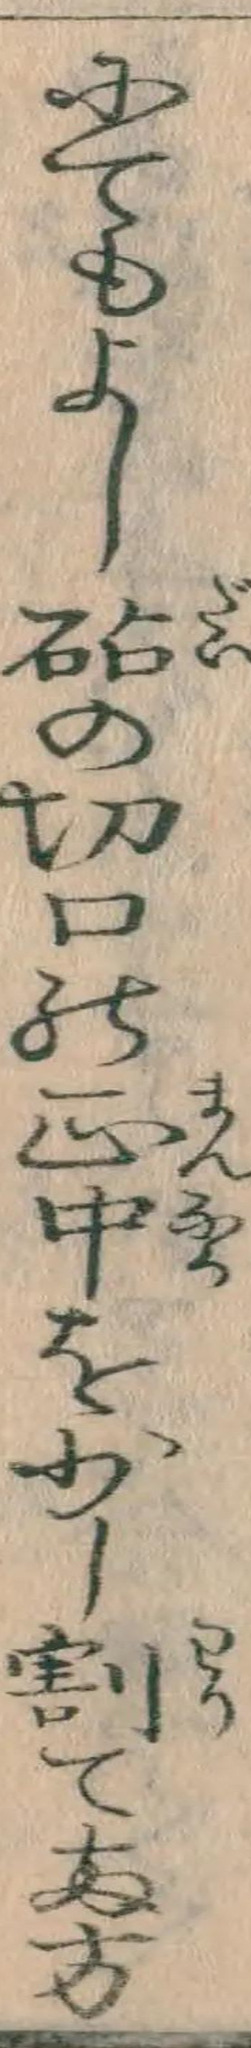にてもよし砧の切口の正中を少し割て両方
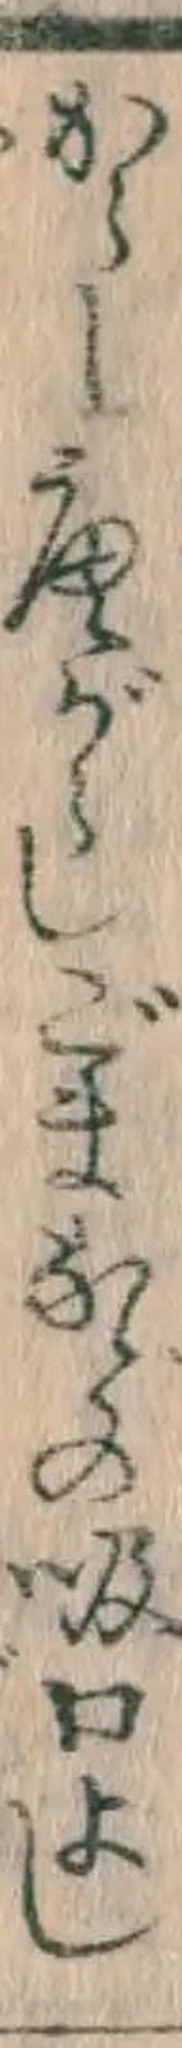からし唐がらしごまなどの吸口よし
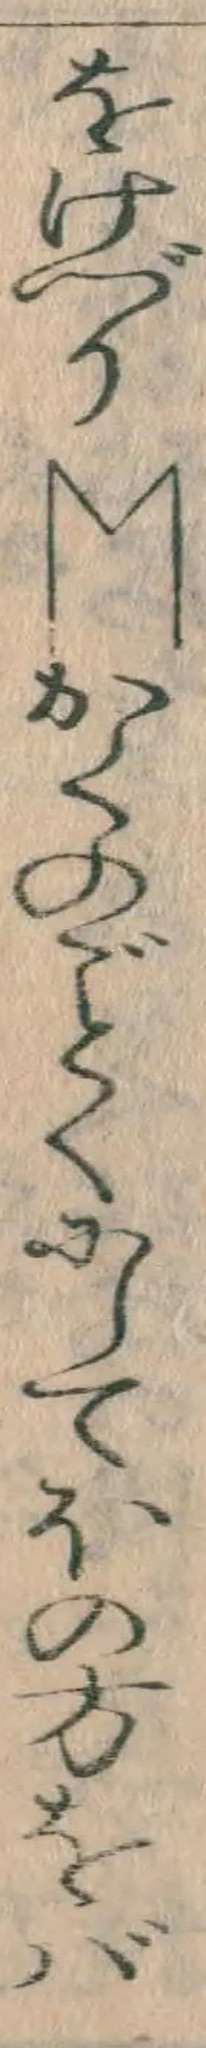をけづりかくのごとくにしてほの方をば
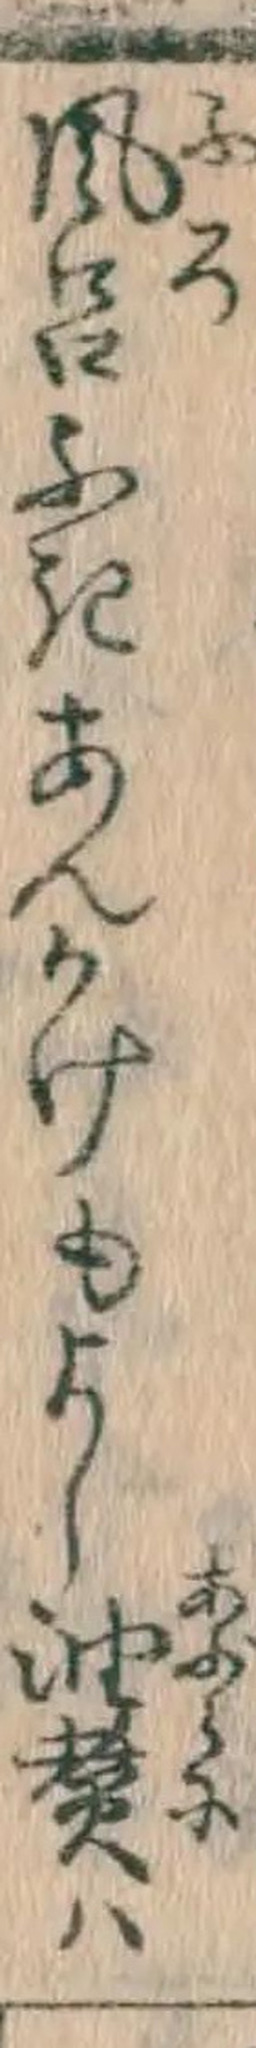風呂ふきあんかけもよし油煮は
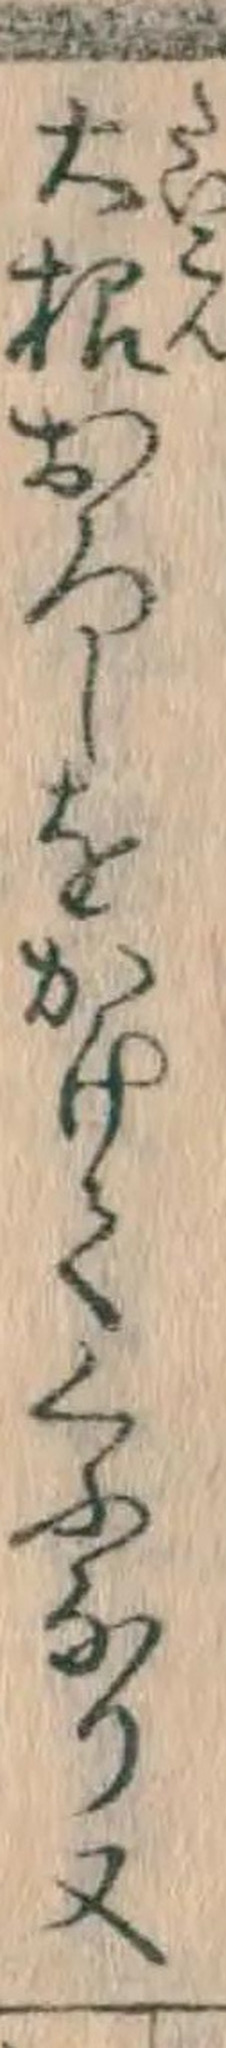大根おろしをかけてくふなり又
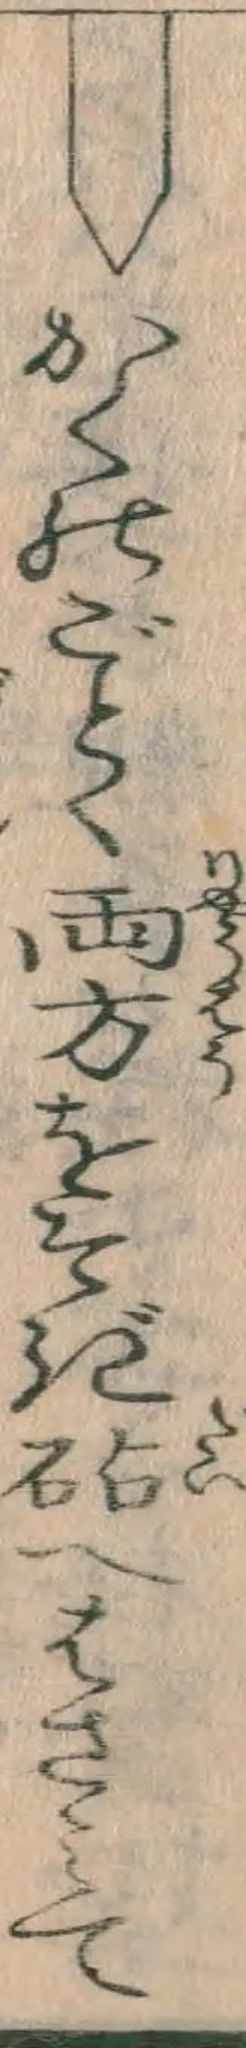かくのごとく両方をそぎ砧へはさみて
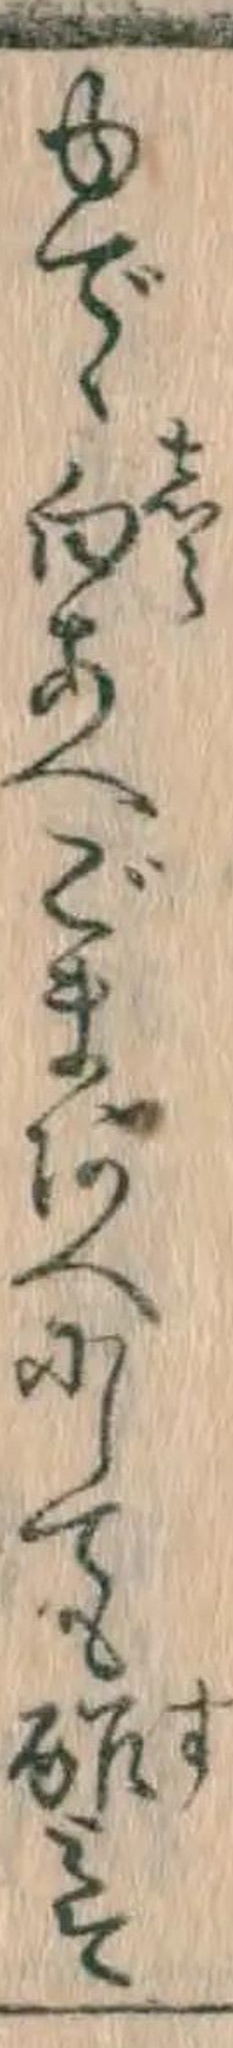ゆでゝ白あへごまあへにしても酢みそ
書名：広益秘事大全 3巻. [5]
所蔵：国立国会図書館 National Diet Library, JAPAN
